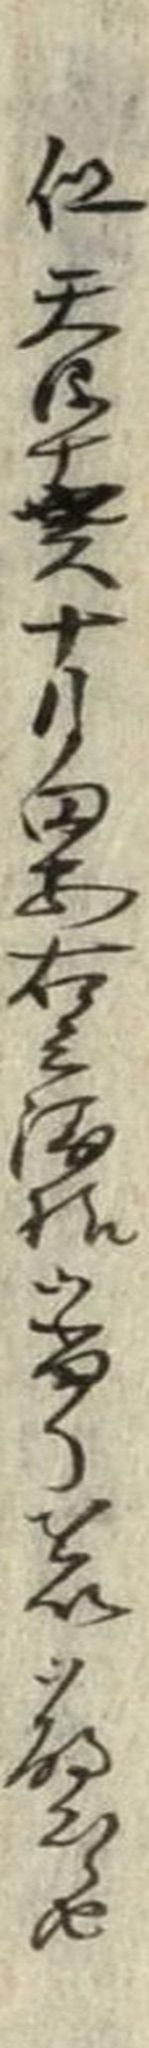但天保十亥十月田安右兵衛様御当りを以御触出候由
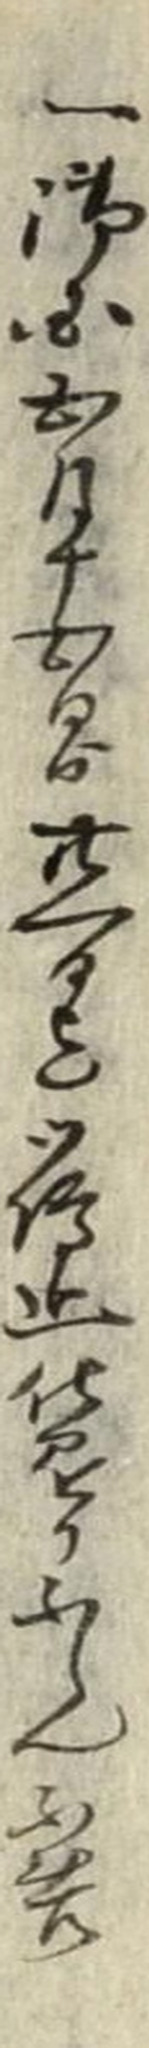一御国五月十五日ゟ廿一日迄御停止仕懸りふしん不苦
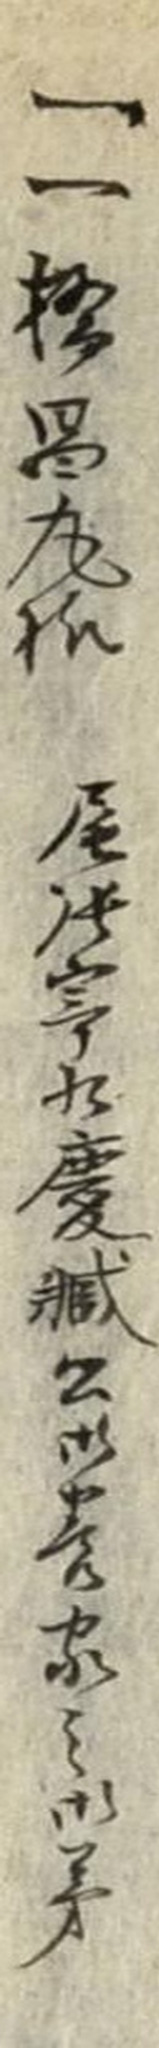一一橋昌丸様尾張宰相慶臧公御養家之御弟
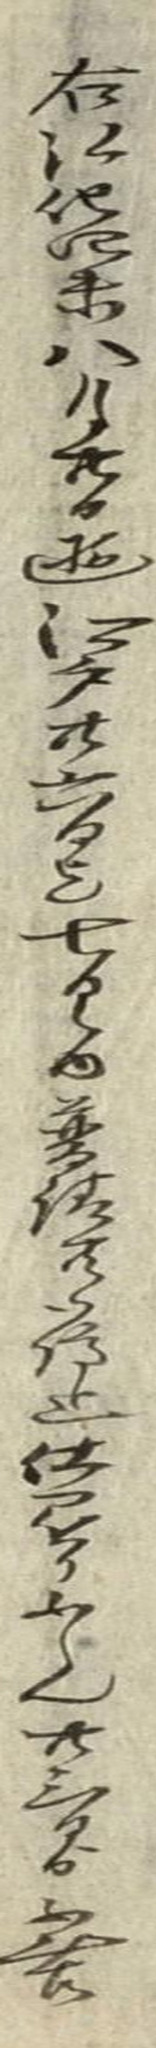右弘化四未八月廿日逝江戸廿六日迄七日之内普請共御停止仕懸りふしん廿三日ゟ不苦
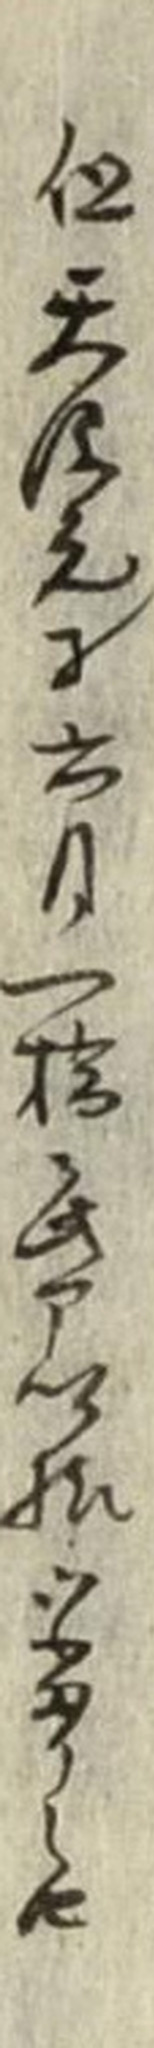但天保元刁六月一橋民部卿様御当り之由
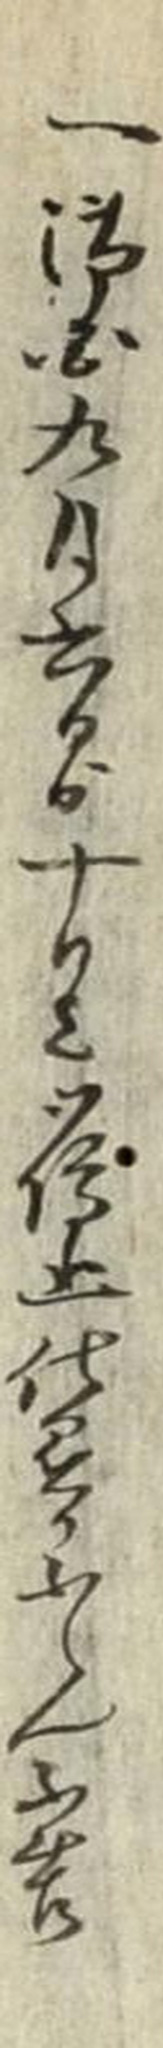一御国九月六日ゟ十日迄御停止仕懸りふしん不苦
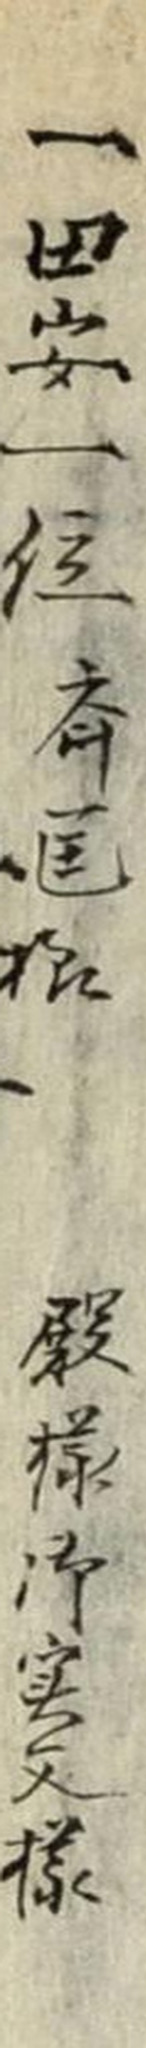一田安一位斉匡様殿様御実父様
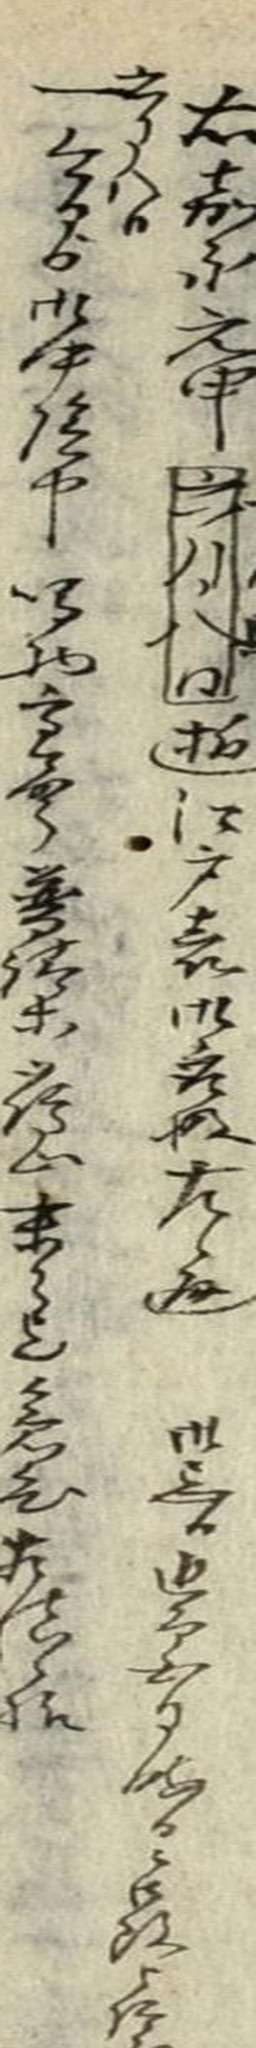一今日ゟ御中陰中鳴物高声普請等御停止末々迄急度相慎候様
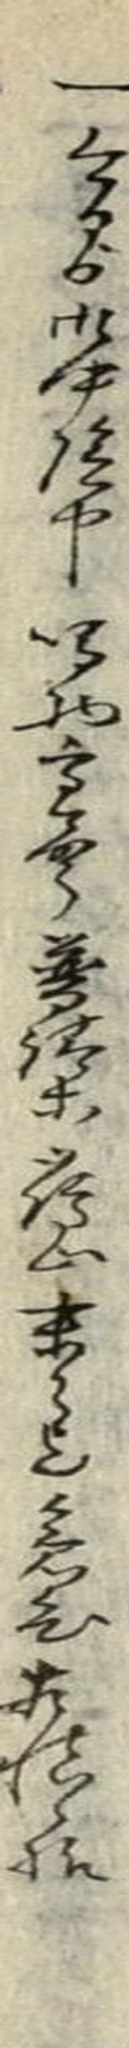一今日ゟ御中陰中鳴物高声普請等御停止末々迄急度相慎候様
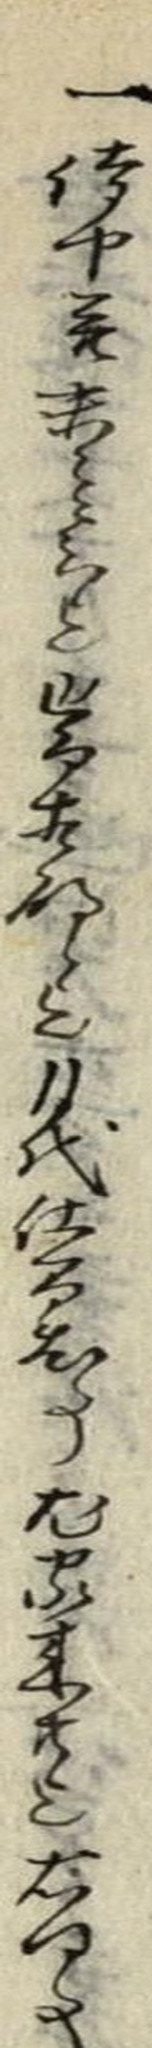一侍中幷末々之者迄追而相触候迄月代仕間敷事尤家来共迄右同事
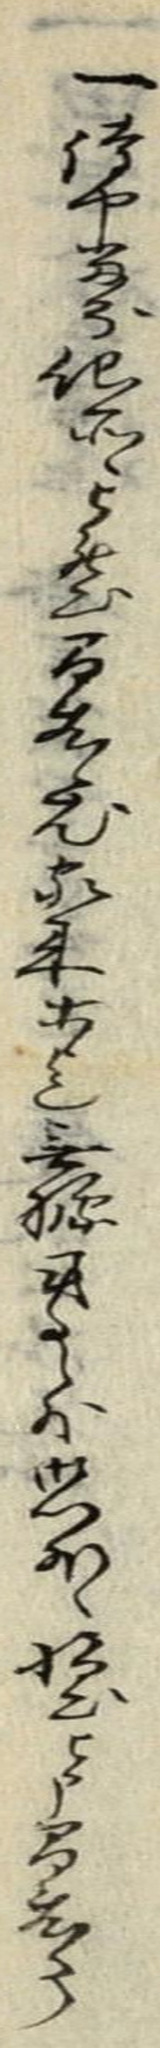一侍中当分他所へ被罷出間敷候尤家来等迄無拠用事之外御門外へ指出申間敷事
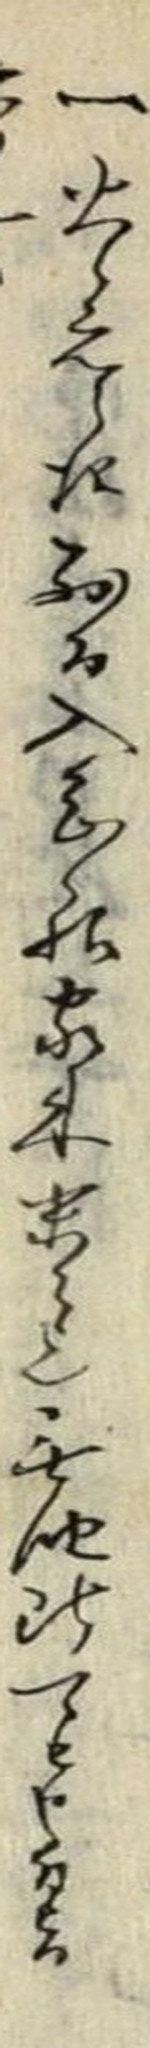一火之元之儀別而入念候様家来末々迄無油断可被申付旨
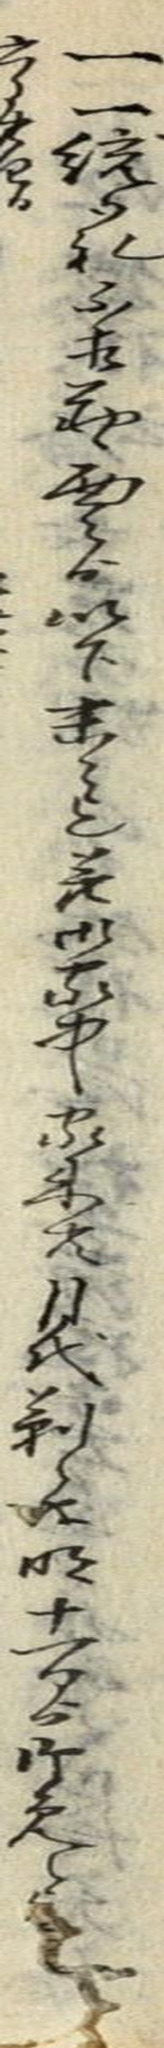一一統御礼不相勤候面々ゟ以下末々迄幷御家中之家来共月代剃候儀明十一日ゟ御免候旨
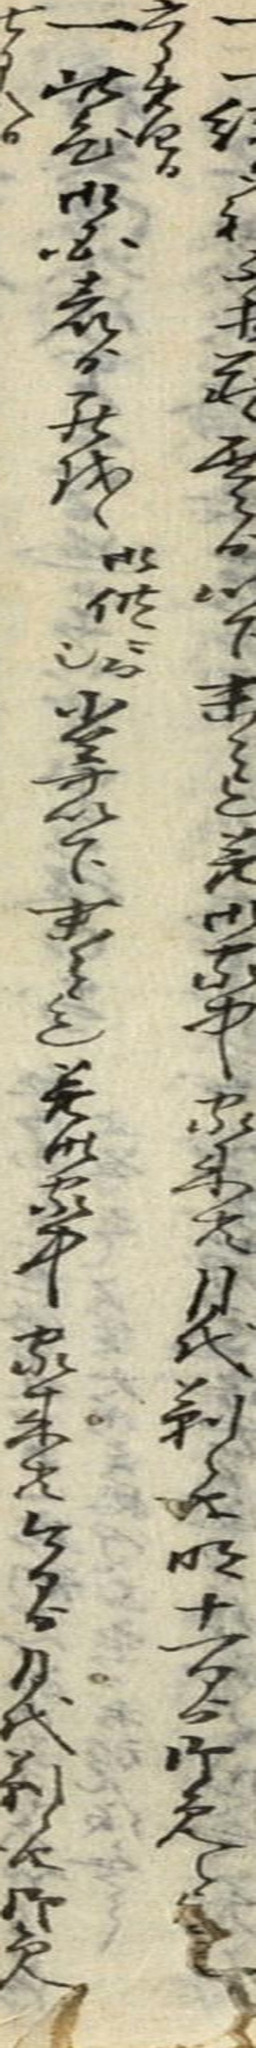一此度御国表ゟ罷越候御供にて也小算以下末々迄幷御家中家来共今日ゟ月代剃候儀御免之旨
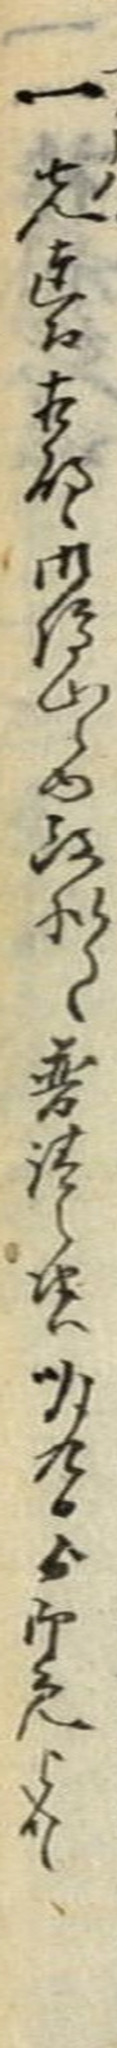一先達而相触候御停止之内致掛り候普請之儀は明九日ゟ御免被成候
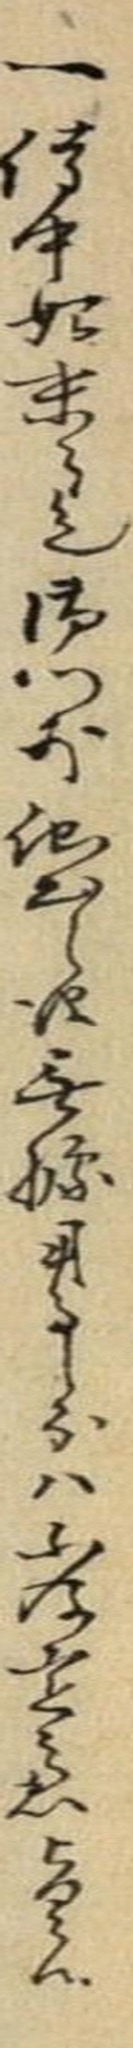一侍中始末々迄御門外他出之儀無據用事之分は不及遠慮旨に候
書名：御停止異変死失
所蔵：福井県文書館 Fukui Prefectural Archives
